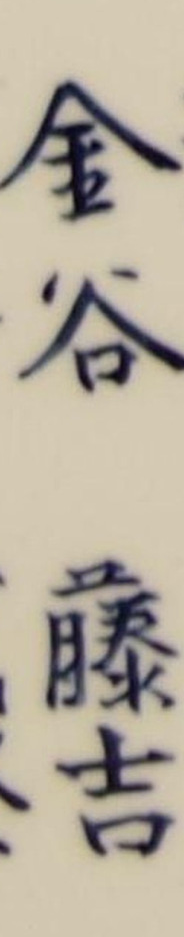金谷藤吉
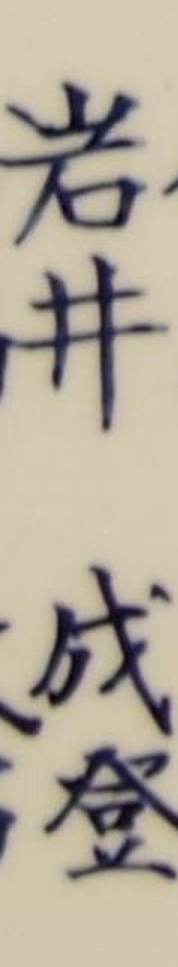岩井成登
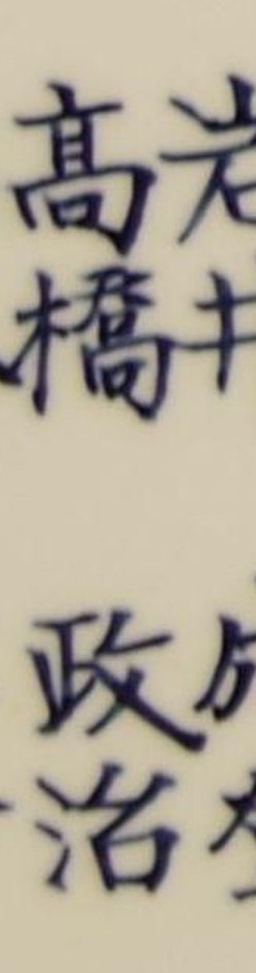高橋政治
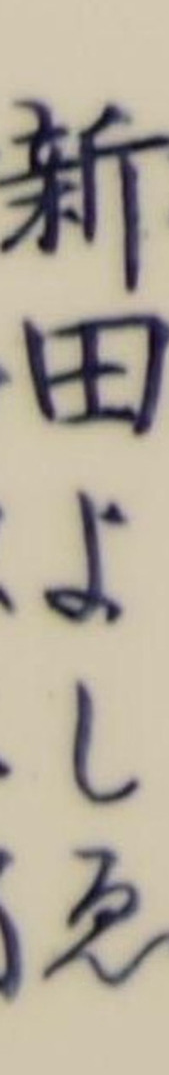新田よしゑ
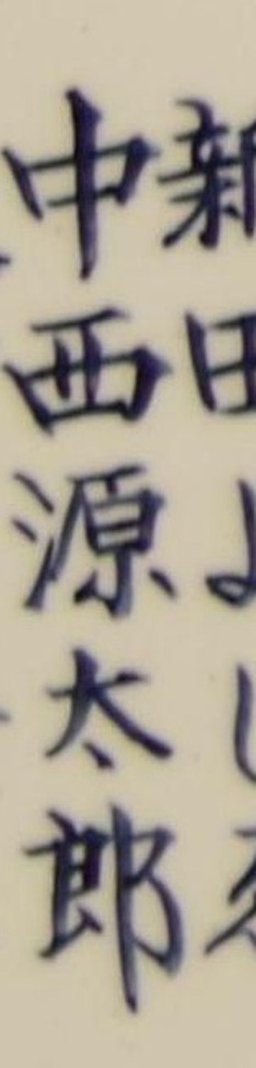中西源太郎
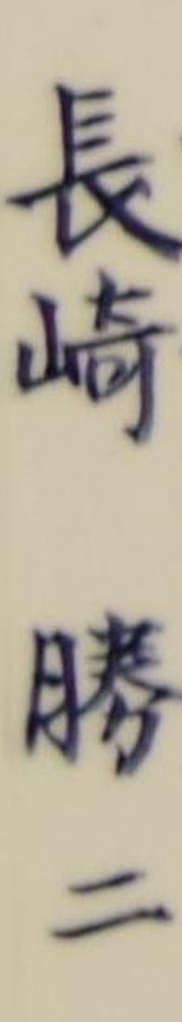長崎勝二

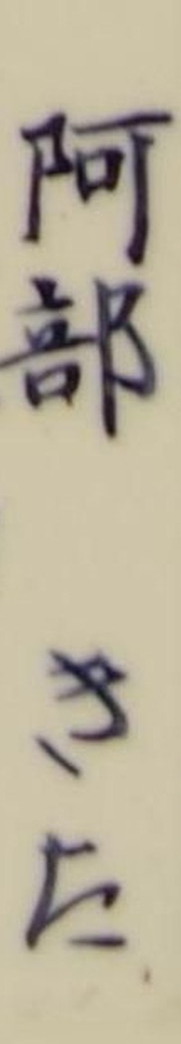阿部きた
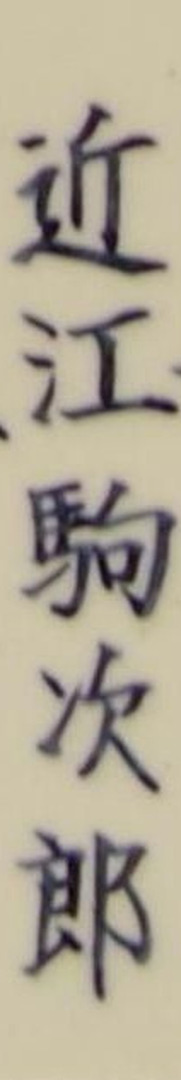近江駒次郎
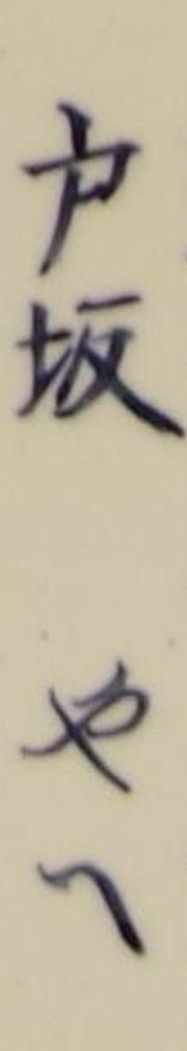戸坂やへ
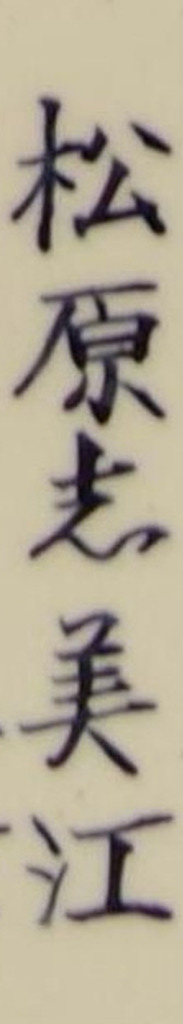松原志美江
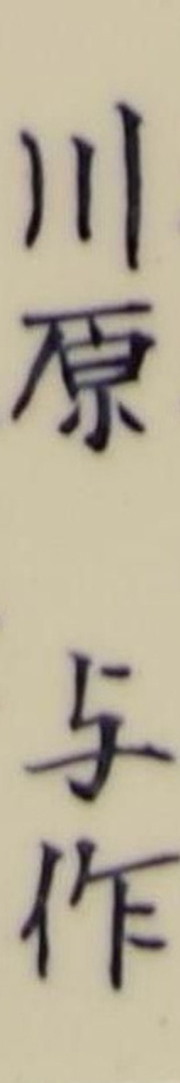川原与作
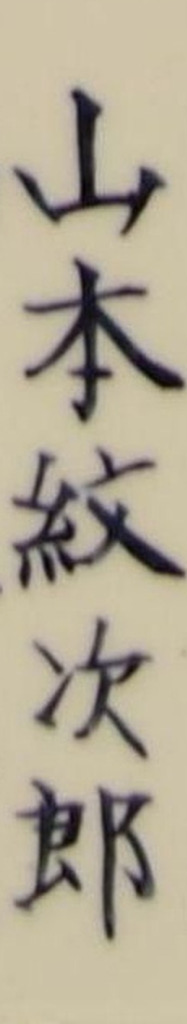山本紋次郎
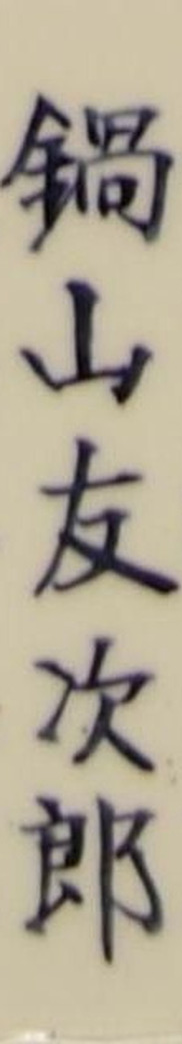鍋山友次郎
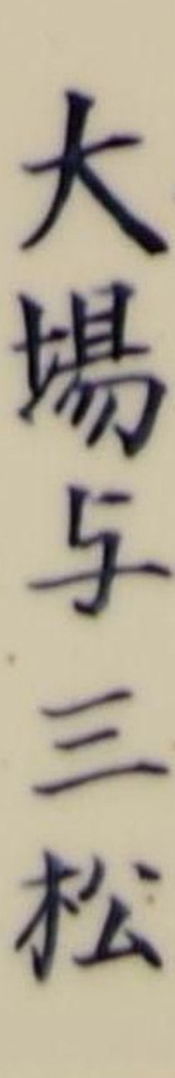大場与三松
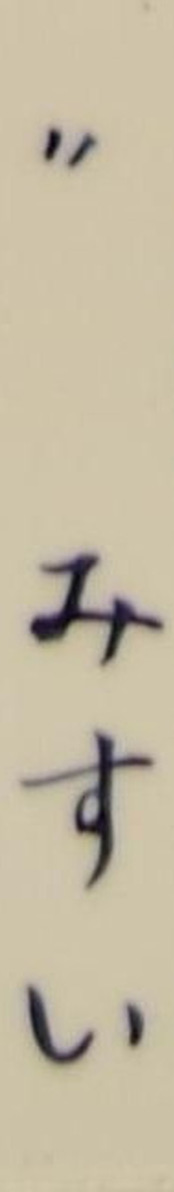みすい
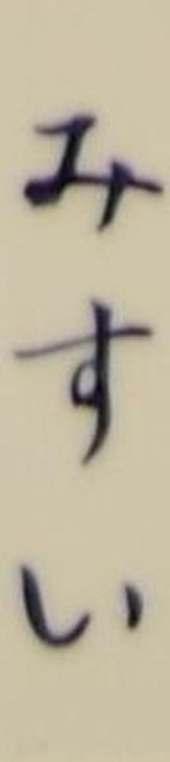みすい
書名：A~D
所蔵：koyasan kongobuji
